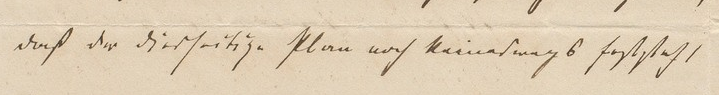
daß der diesseitige Plan noch keineswegs feststeht .
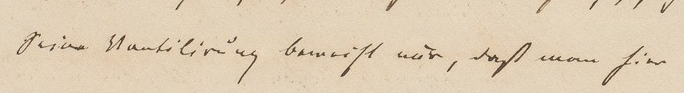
Seine Ventilirung beweist mir, daß man hier
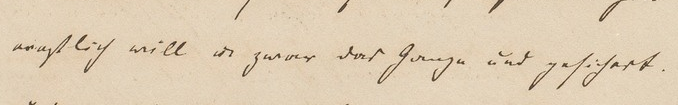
ernstlich will u. zwar das Ganze und gesichert.
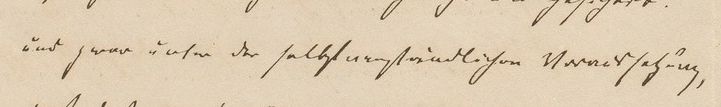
und zwar unter der selbstverständlichen Voraussetzung,
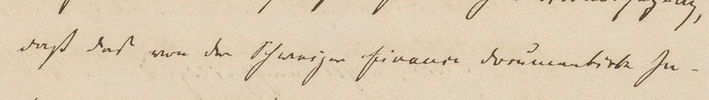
daß das von der Schweizer Finance documentirte In-
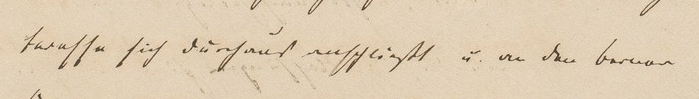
teresse sich durchaus anschließt u. an den Berner
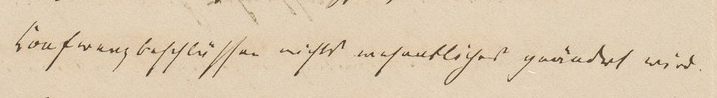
Conferenzbeschlüssen nichts wesentliches geändert wird .
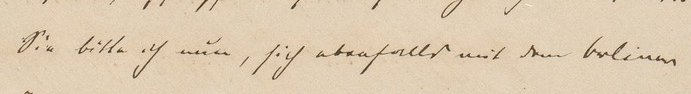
Sie bitte ich nun, sich ebenfalls mit dem Berliner
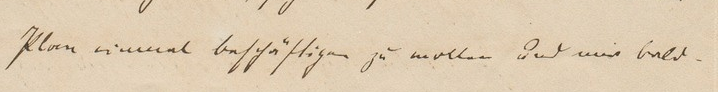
Plan einmal beschäftigen zu wollen und mir bald-
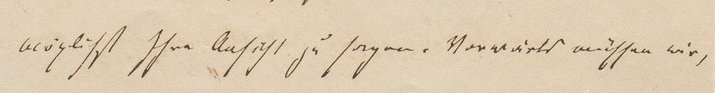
möglichst Ihre Ansicht zu sagen. Vorwärts müssen wir,
